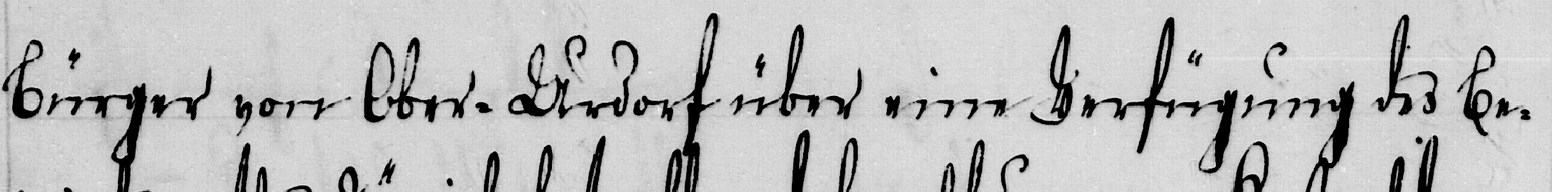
Bürger von Ober-Urdorf über eine Verfügung des Be¬
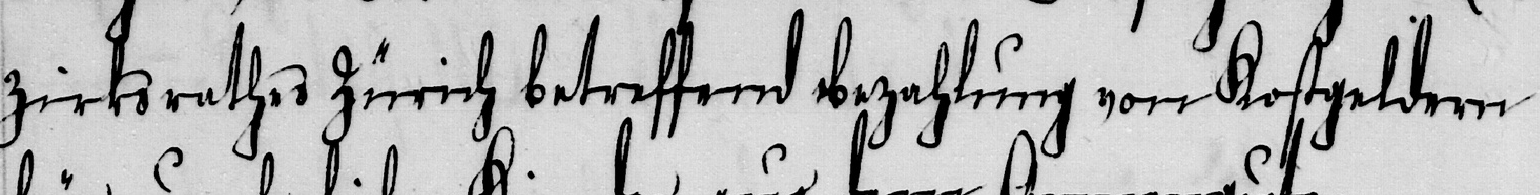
zirksrathes Zürich betreffend Bezahlung von Kostgeldern
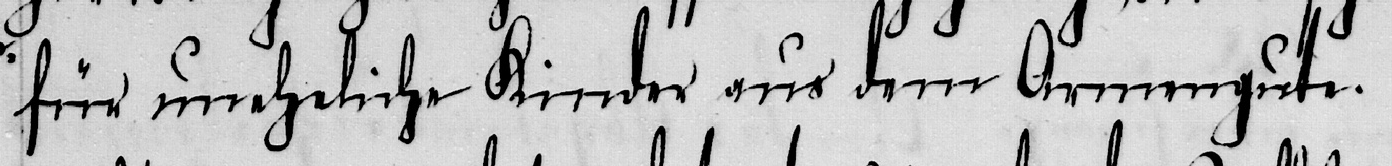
für uneheliche Kinder aus dem Armengute.
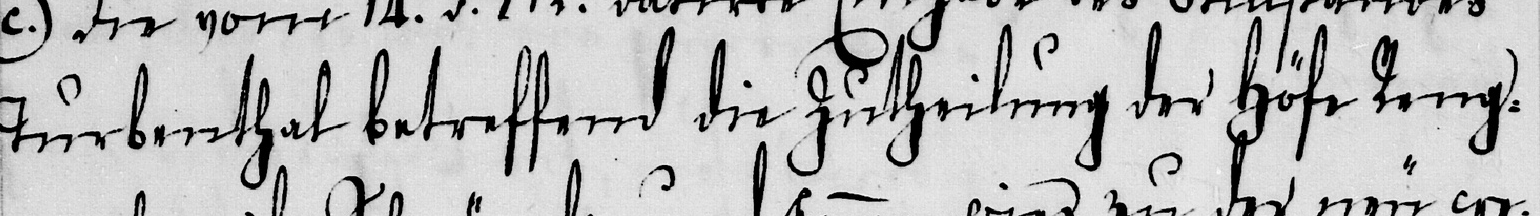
Turbenthal betreffend die Zutheilung der Höfe Reng¬
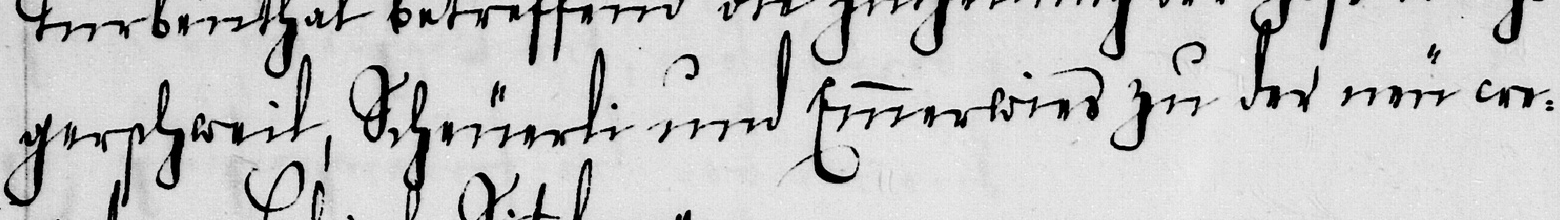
gerschweil, Scheuerli und Emmerwies zu der neu cre¬
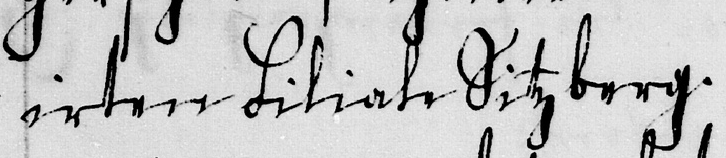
irten Filiale Sitzberg.
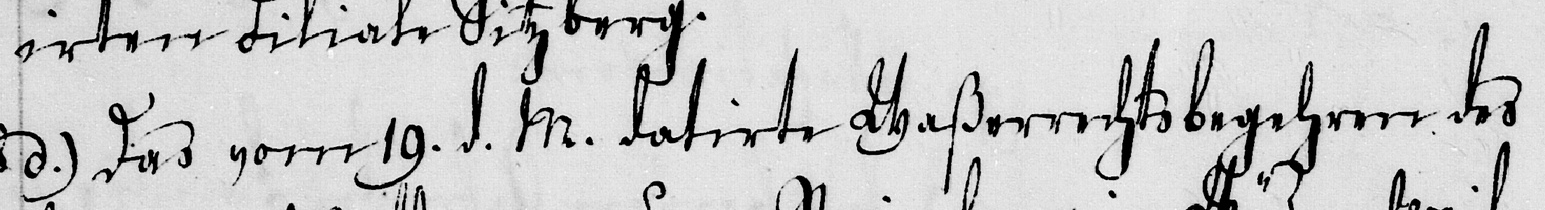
d.) Das vom 19. d. M. datirte Waßerrechtsbegehren des
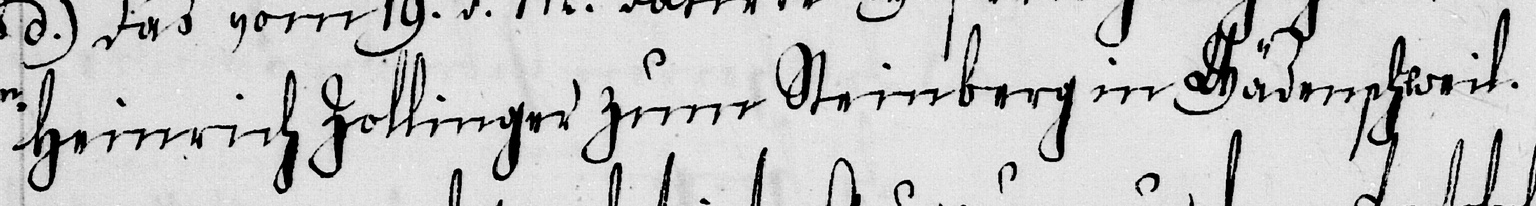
Heinrich Zollinger zum Steinberg in Wädenschweil.
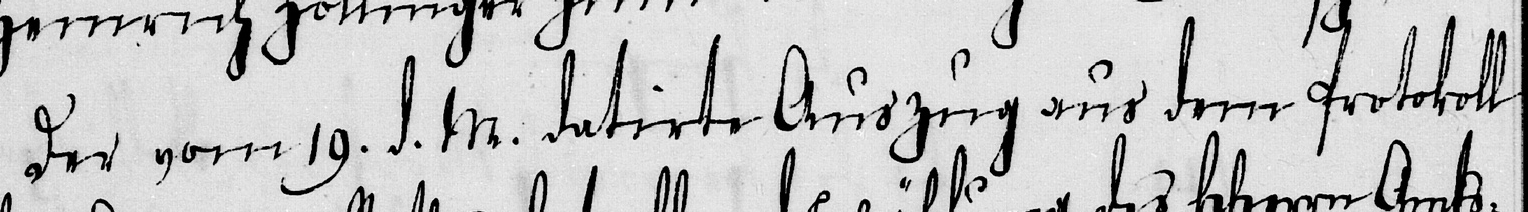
Der vom 19. d. M. datirte Auszug aus dem Protokoll
